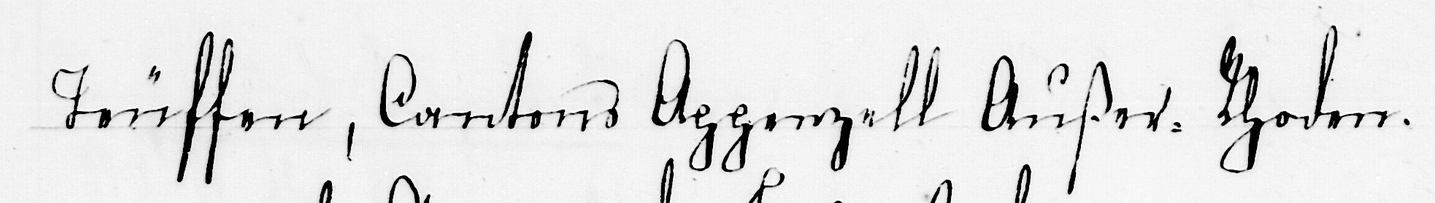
Teuffen, Cantons Appenzell Außer-Rhoden.
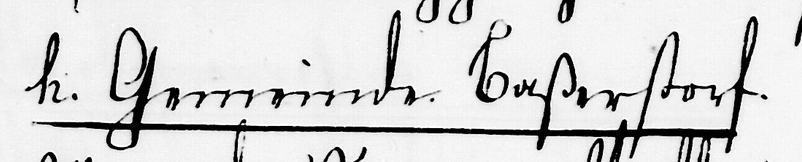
h. Gemeinde Baßerstorf.
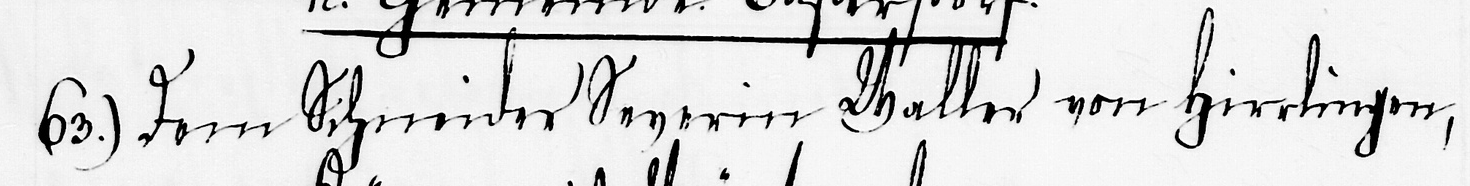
63.) Dem Schneider Severin Waller von Hirrlingen,
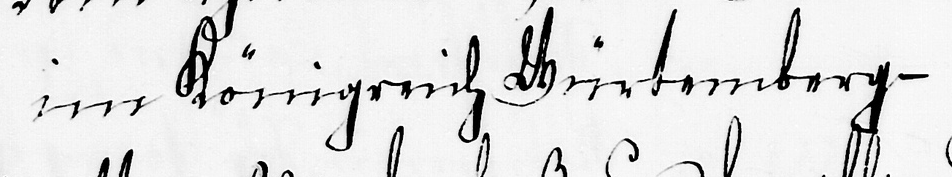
im Königreich Würtemberg –
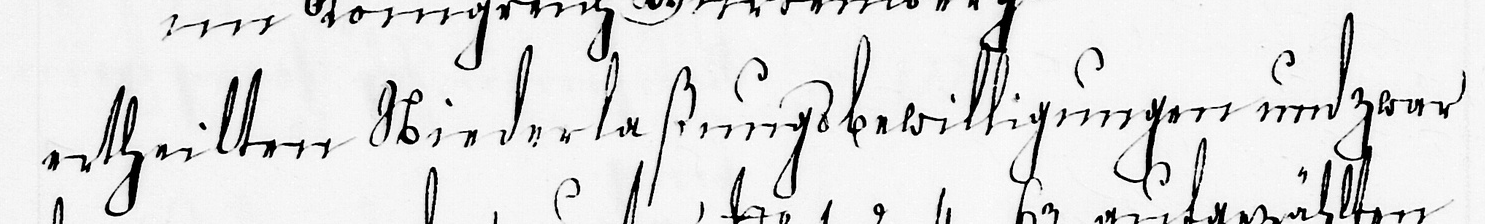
ertheilten Niederlaßungsbewilligungen und zwar
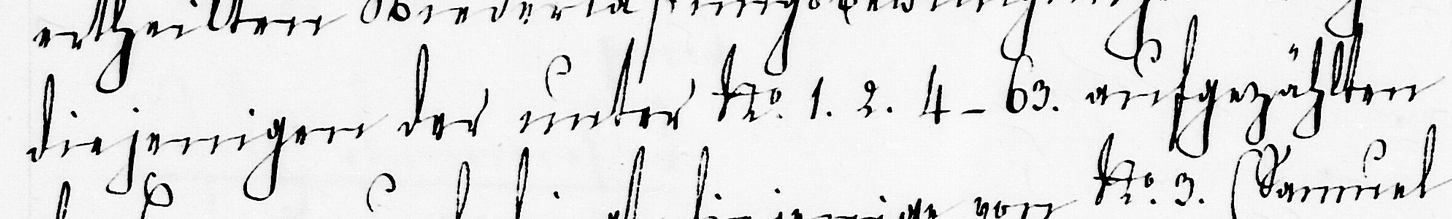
diejenigen der unter No. 1. 2. 4–63. aufgezählten
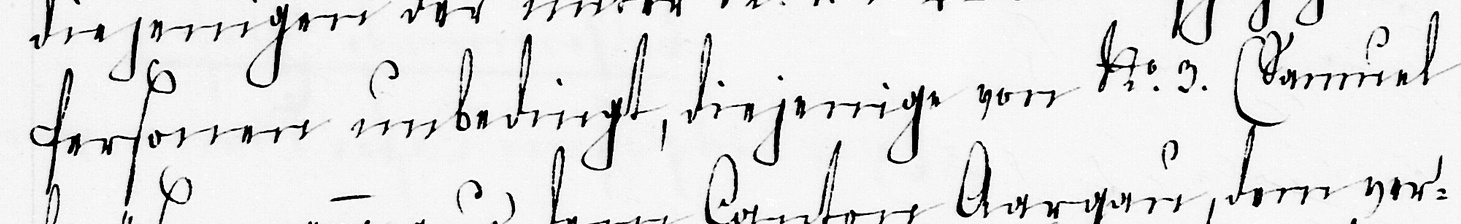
Personen unbedingt, diejenige von No. 3. (Samuel
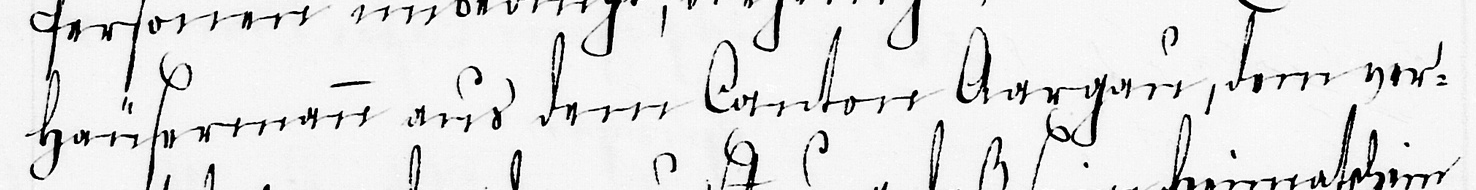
Häusermann aus dem Canton Aargau, dem ver¬
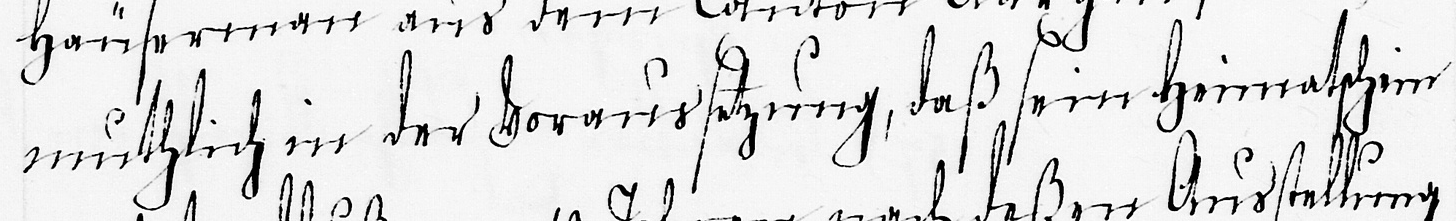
muthlich in der Voraussetzung, daß sein Heimatschein
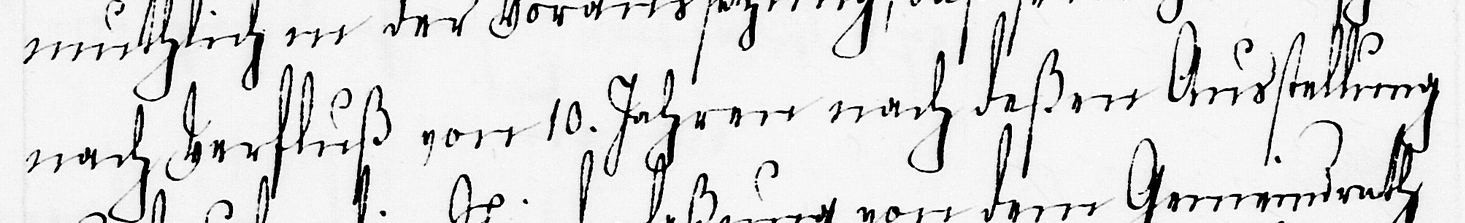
nach Verfluß von 10. Jahren nach deßen Ausstellung
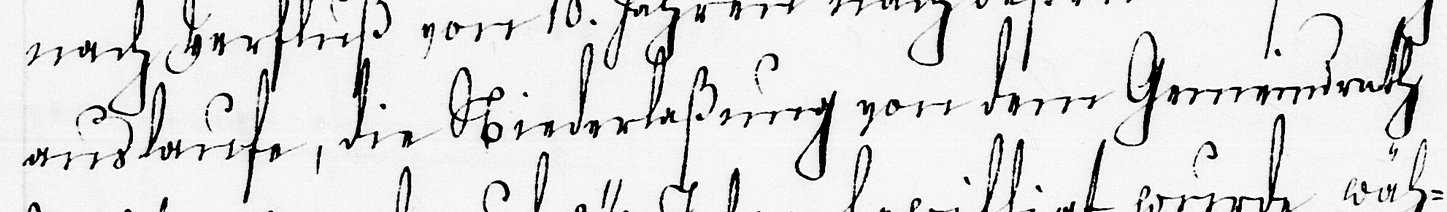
auslaufe, die Niederlaßung von dem Gemeindrath
